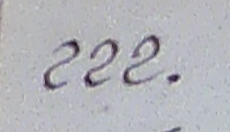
222.
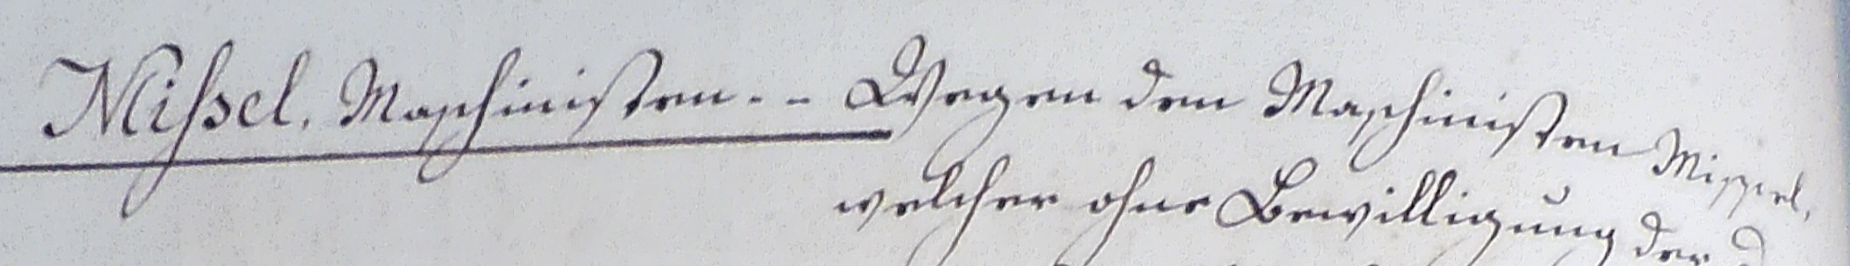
Missel, Maschinisten. .. Wegen dem Maschinisten Missel,
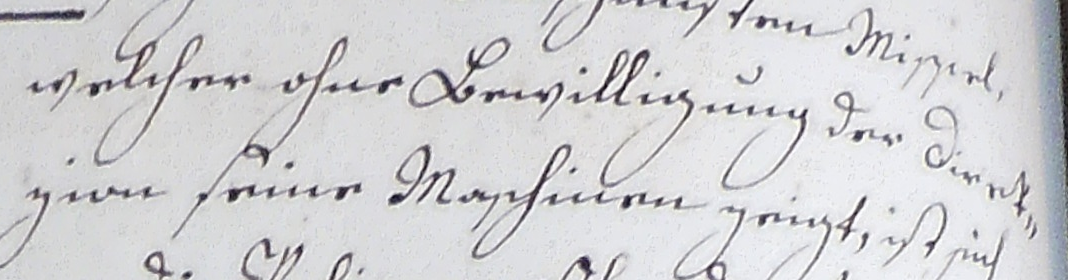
welcher ohne Bewilligung der Direk¬
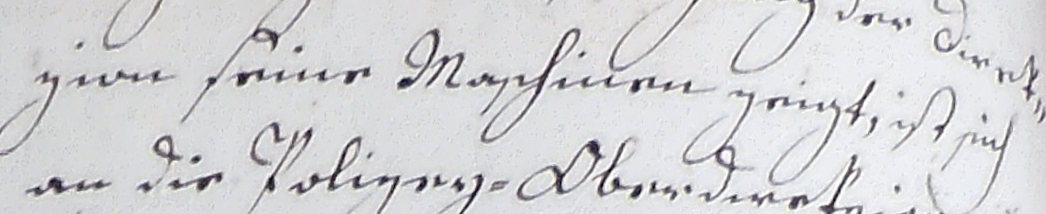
zion seine Maschinen zeigt, ist sich
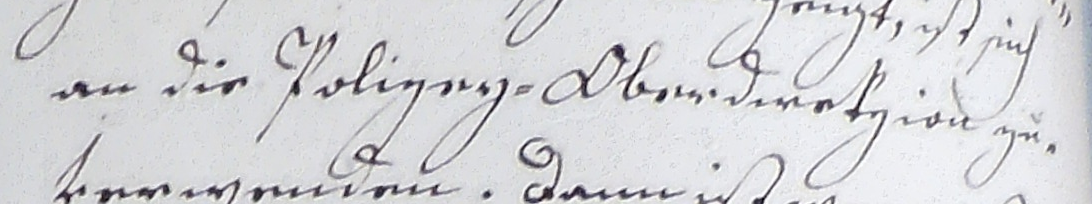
an die Polizey=Oberdirekzion zu¬
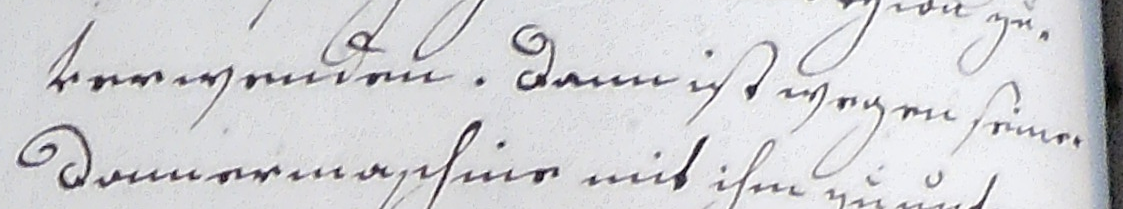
verwenden. Dann ist wegen seiner
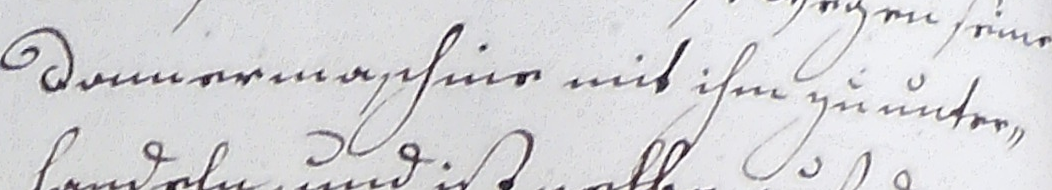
Donnermaschine mit ihm zu unter¬
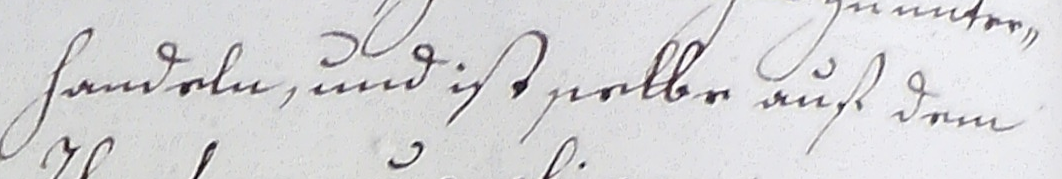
handeln, und ist selbe auf dem
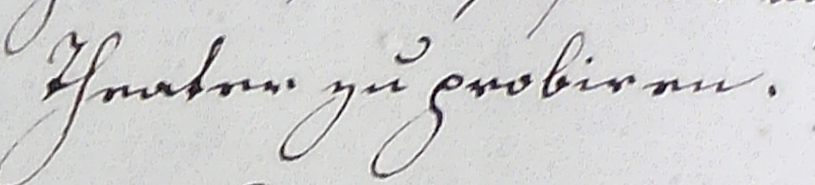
Theater zu probiren.
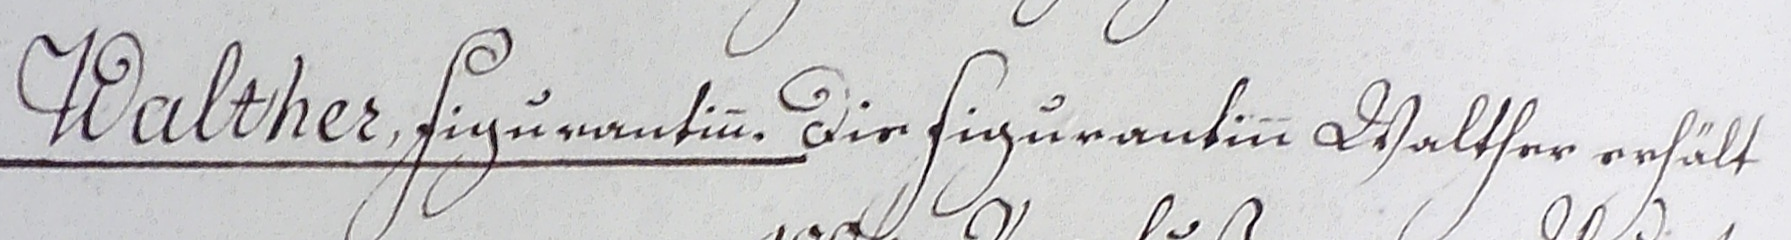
Walther, Figurantin̅. Die Figurantin̅ Walther erhält
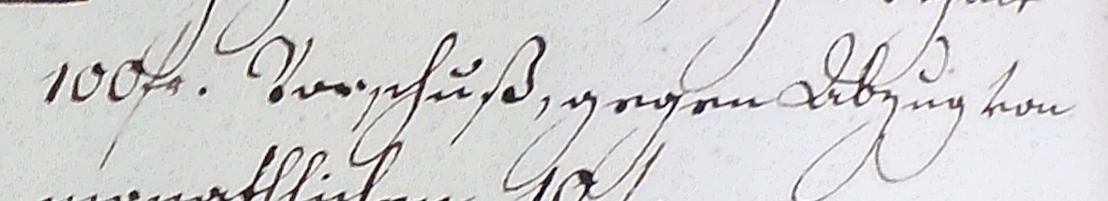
100fr. Vorschuß, gegen Abzug von
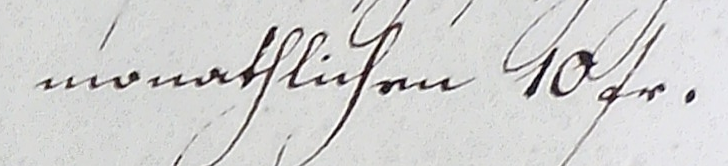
monathlichen 10fr.
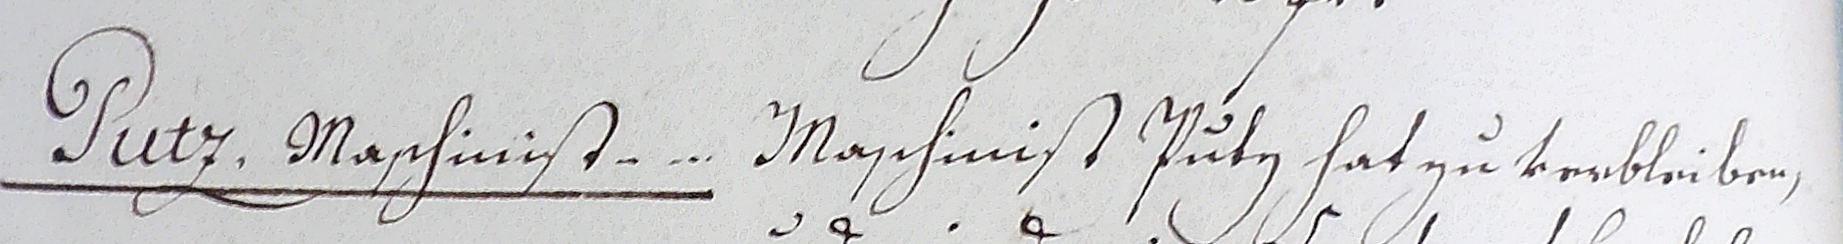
Putz, Maschinist .. ... Maschinist Putz hat zu verbleiben,
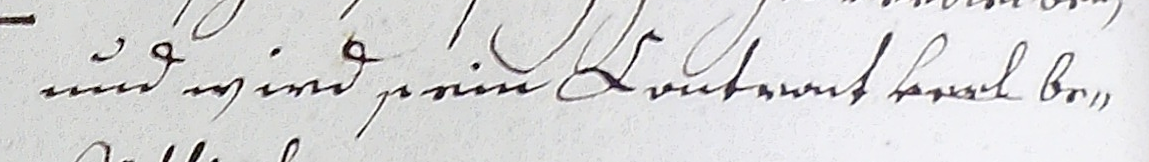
und wird sein Contract verl be¬
